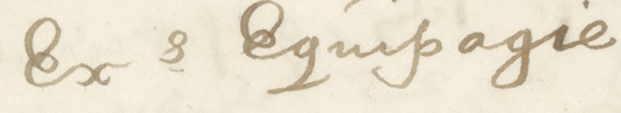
Exs Equipagie
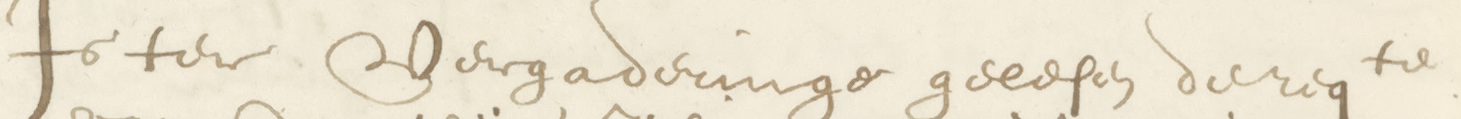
Is ter Vergaderinge gelesen de reqte.
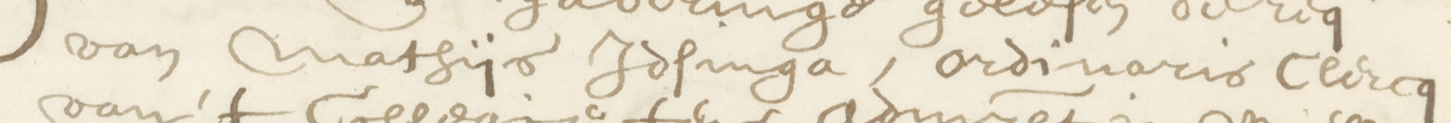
van Mathijs Idsinga, ordinaris Clercq
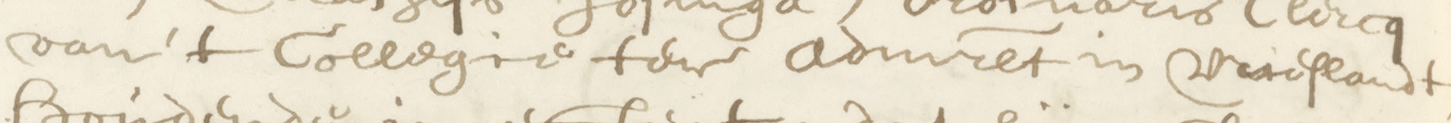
van 't Collegie ter Admret in Vrieslandt,
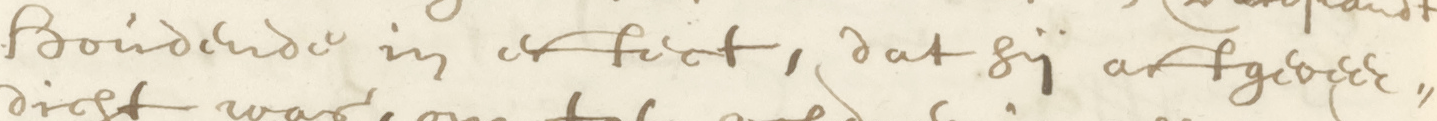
houdende in effect, dat hij affgeveer„
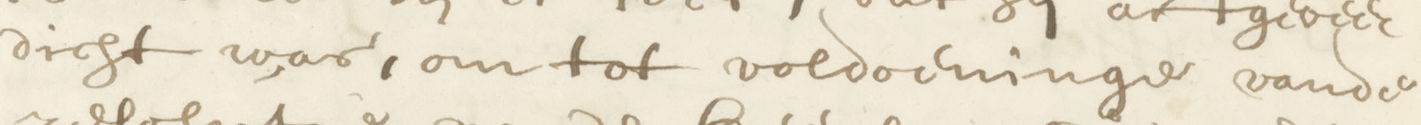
dicht was, om tot voldoeninge vande
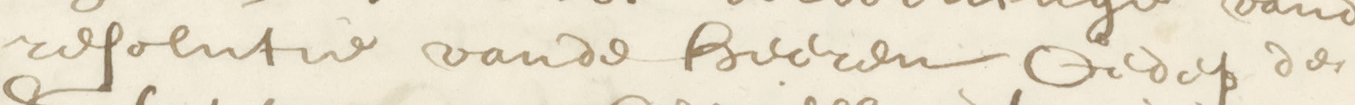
resolutie vande Heeren Gedepden.
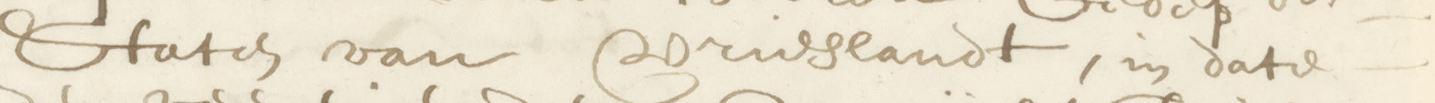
Staten van Vrieslandt, in date -
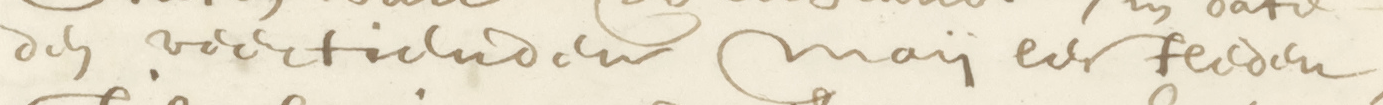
den veertienden Maij lestleden,
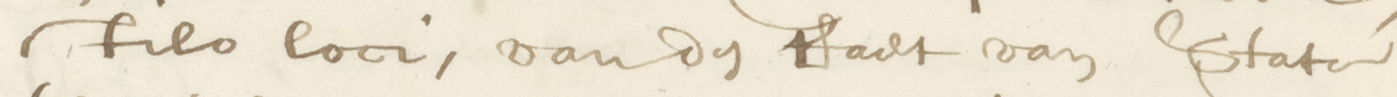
stilo loci, van den Raet van State
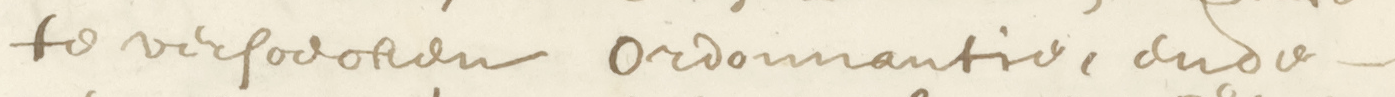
te versoecken Ordonnantie, ende
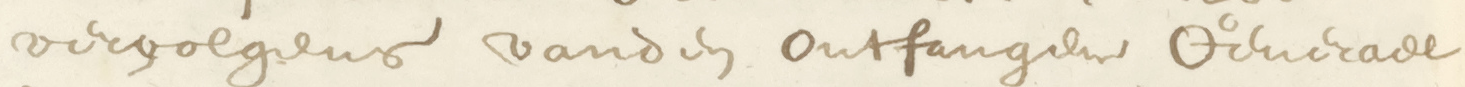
vervolgens vanden Ontfanger Generael
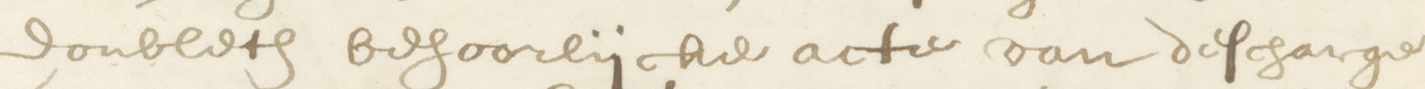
Doubleth behoorlijcke acte van descharge
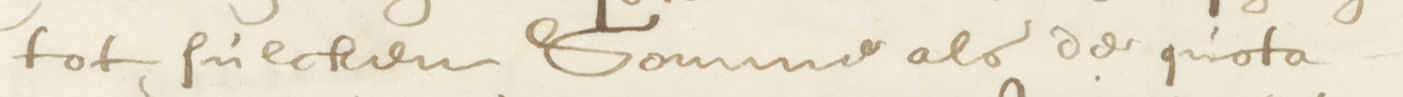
tot sulcken Somme als de quota
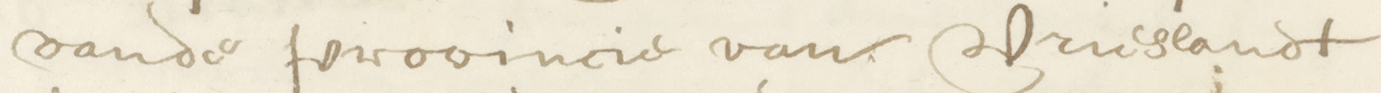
vande Provincie van Vrieslandt
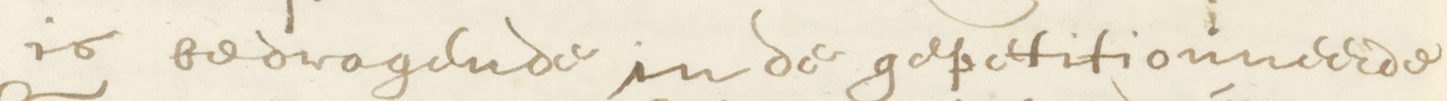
is bedragende in de gepetitionneerde
